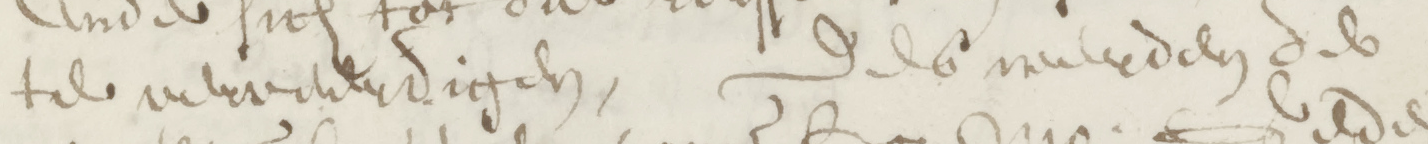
te verveerdigen. Des werden de
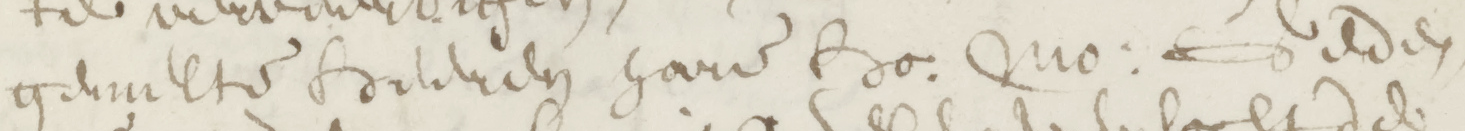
gemelte Heeren hare Ho:Mo: Gede„
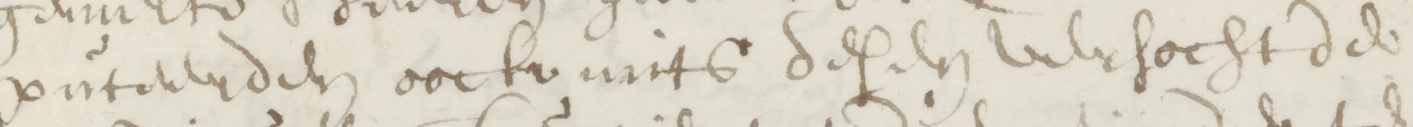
puteerden oock mits desen versocht de
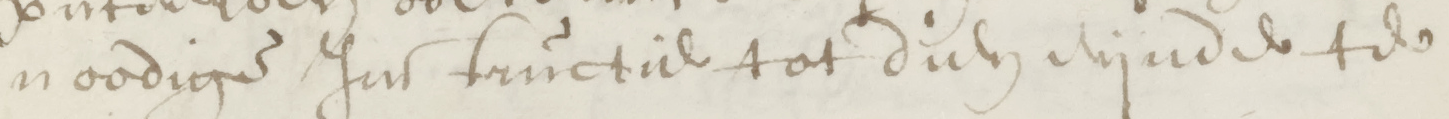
noodige Instructie tot dien eijnde te
